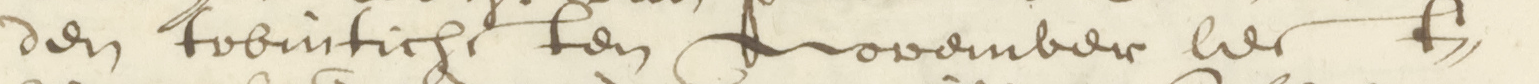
den twintichsten November lest„
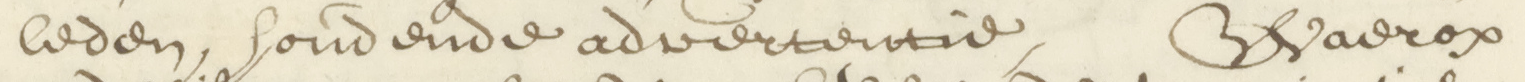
leden, houdende advertentie. Waerop
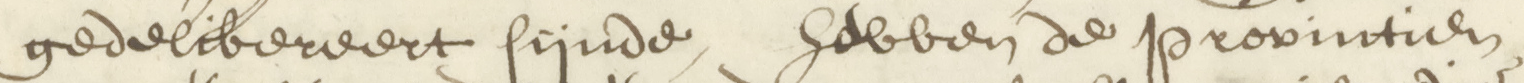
gedelibereert sijnde, hebben de Provintien
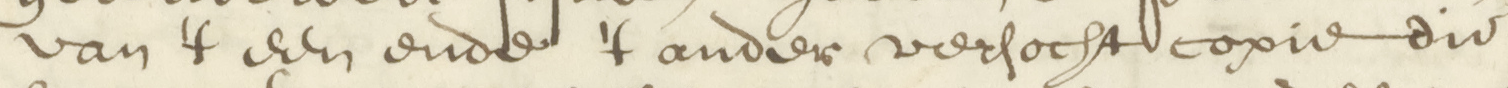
van ‛t een ende ‛t ander versocht copie die
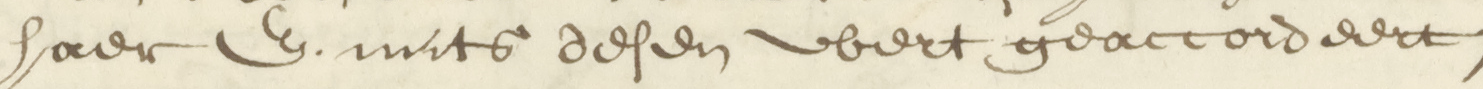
haer E. mits desen wert geaccordeert;
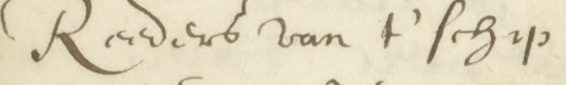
Reeders van t'schip
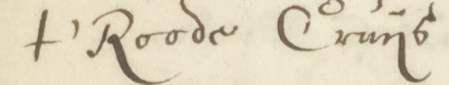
t'Roode Cruijs
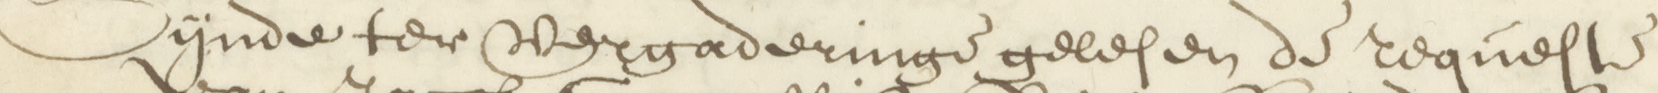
Sijnde ter Vergaderinge gelesen de requeste
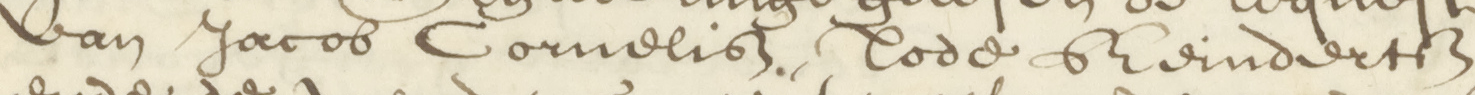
van Jacob Cornelisz., Tode Reindertsz.
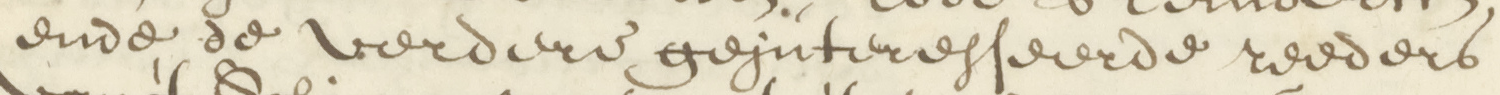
ende de verdere geinteresseerde reeders
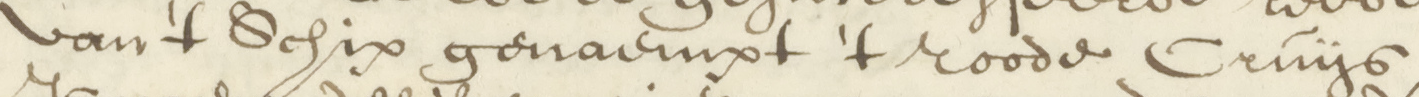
van 't Schip genaempt 't roode Cruijs;
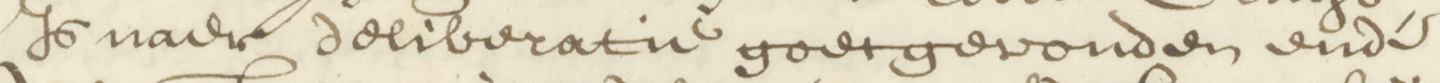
Is naer deliberatie goetgevonden ende
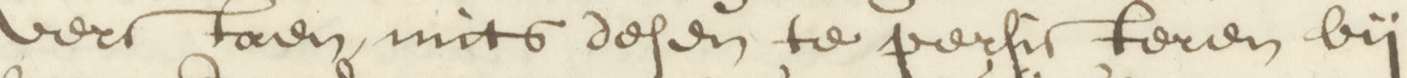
verstaen, mits desen te persisteren bij
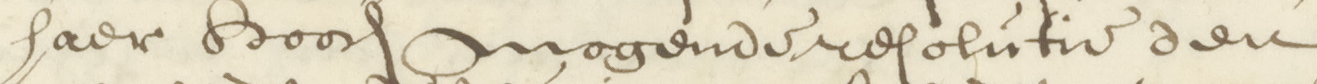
haer Hooch Mogende resolutie den
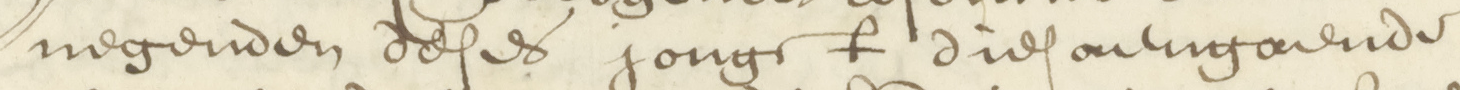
negenden deses jongst diesaengaende
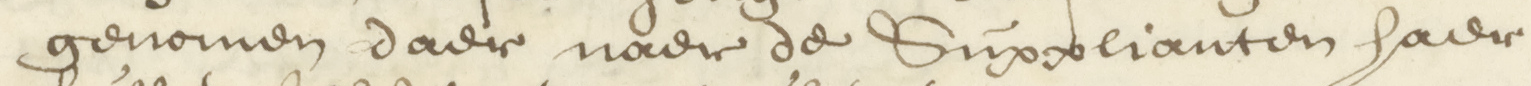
genomen daer naer de Supplianten haer
